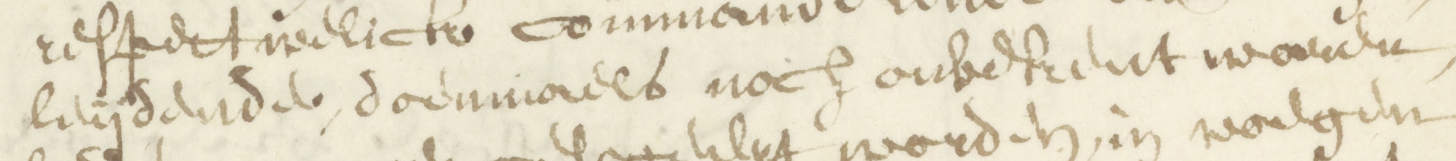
leijdende, doenmaels noch onbekent waeren,
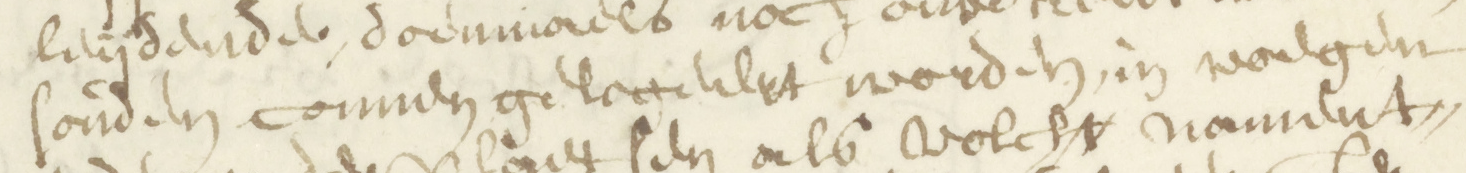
souden connen gelogeert worden, in voegen
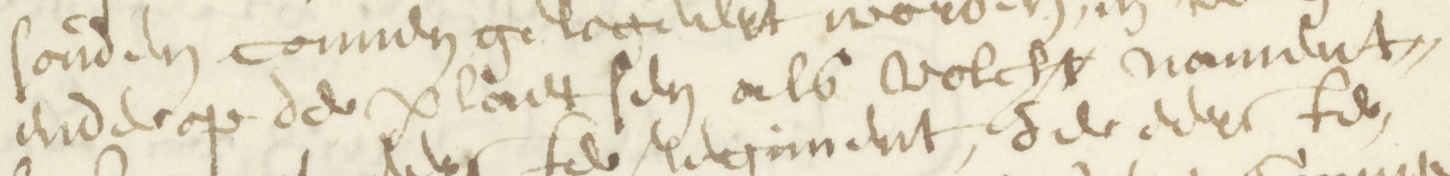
ende op de paetsen als volcht nament„
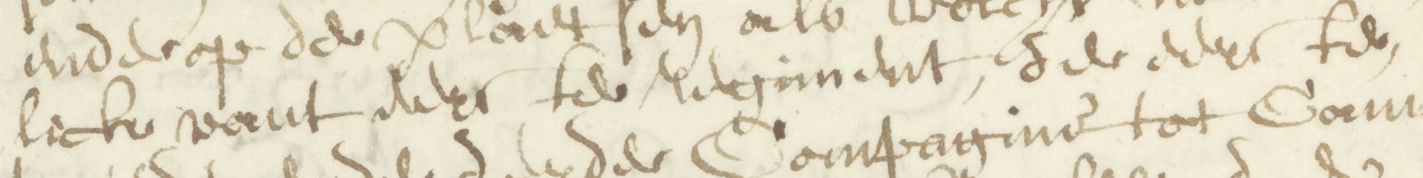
lick vant eerste regiment, de eerste,
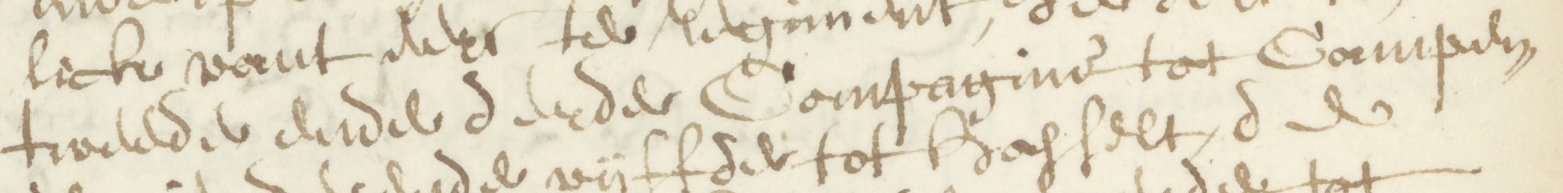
tweede ende derde Compagnie tot Campen,
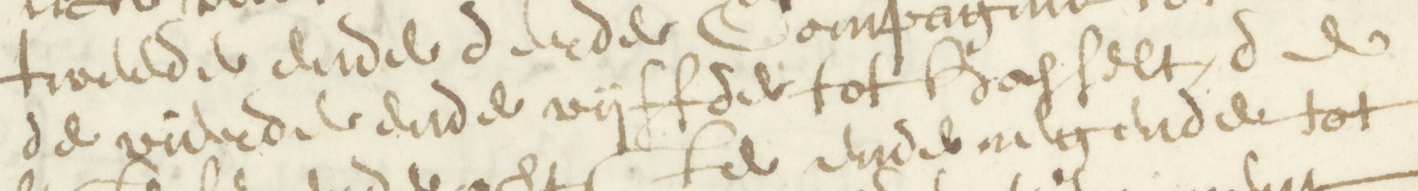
de vierde ende vijffde tot Hasselt, de
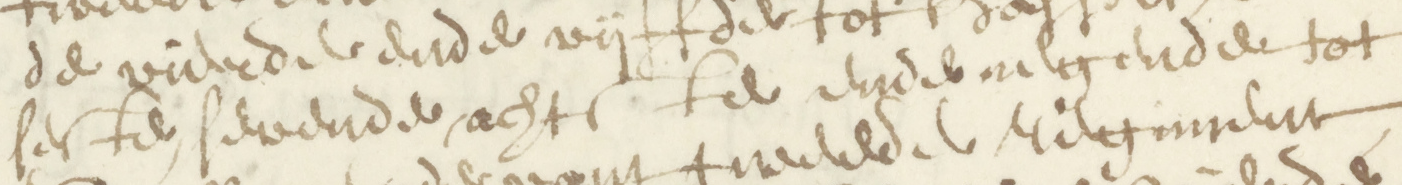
seste sevende, achtste ende negende tot
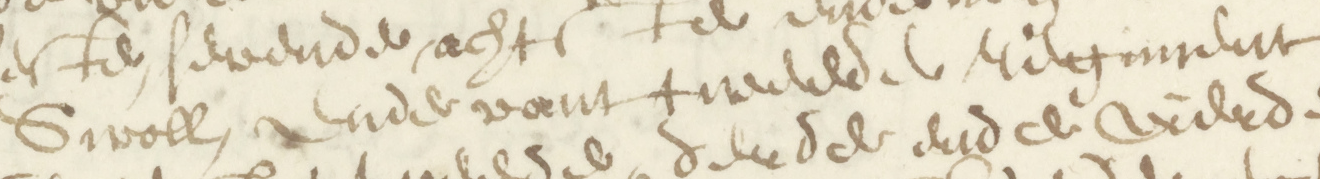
Swoll. Ende vant tweede regiment
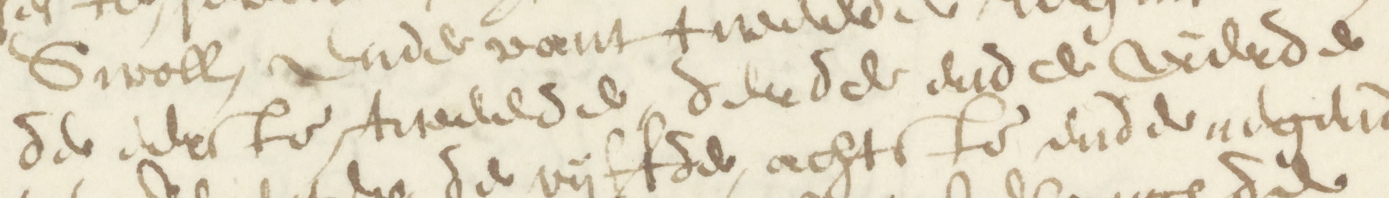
de eerste, tweede derde ende vierde
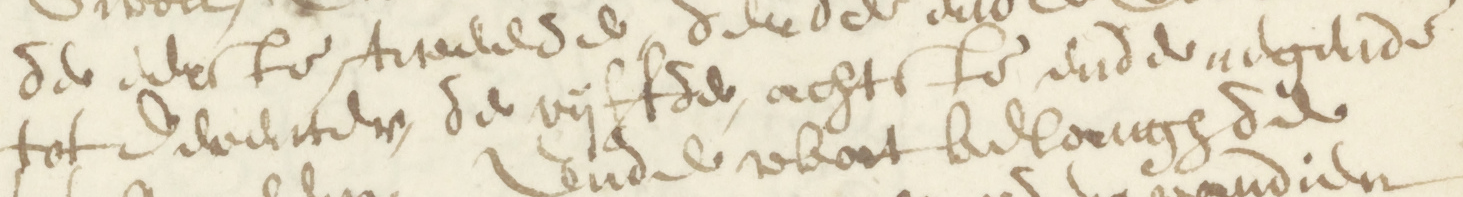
tot Deventer de vijffde, achtste ende negende
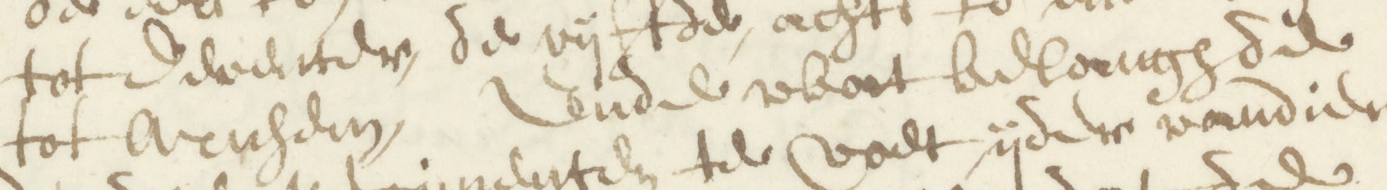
tot Arnhem. Ende wat belangh de
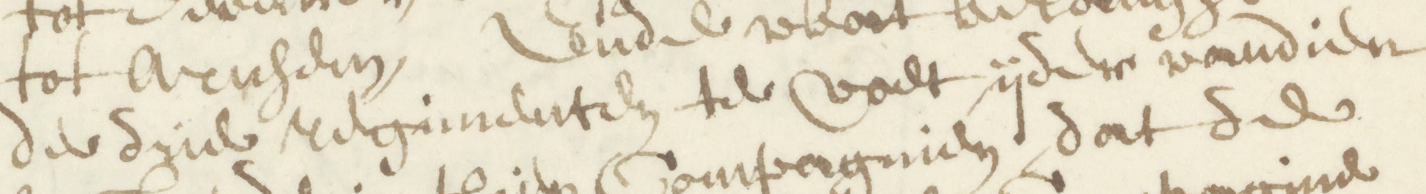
de drie regimenten te voet, ijder vandien
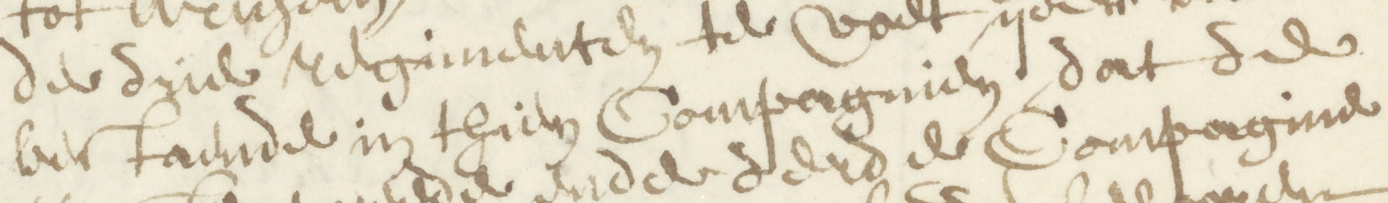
bestaende in thien compagnien, dat de
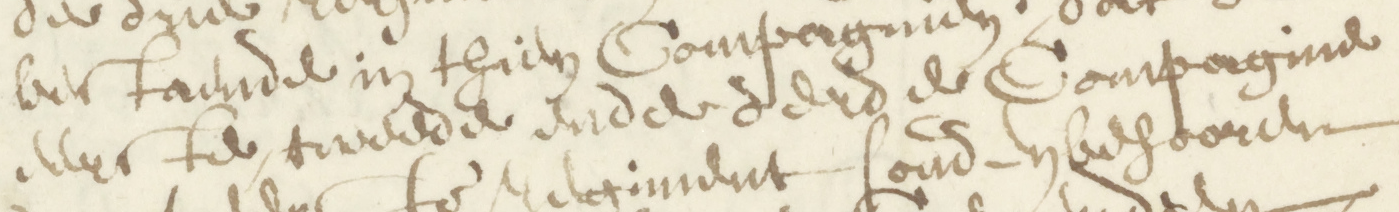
eerste, tweede ende derde Compagnie
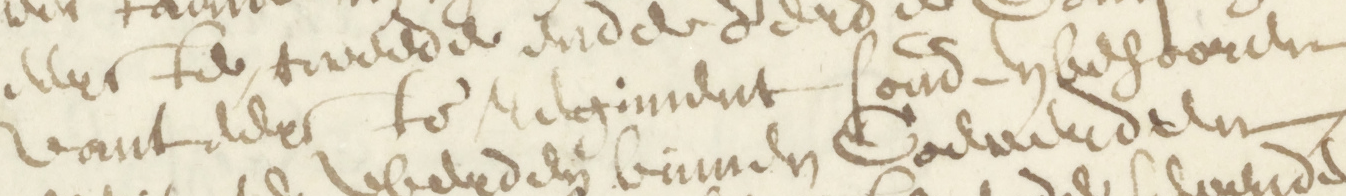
vant eerste regiment souden behooren
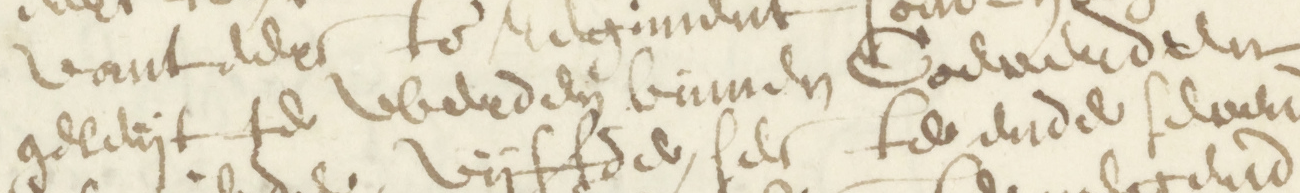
geleijt te werden binnen Coeverden
